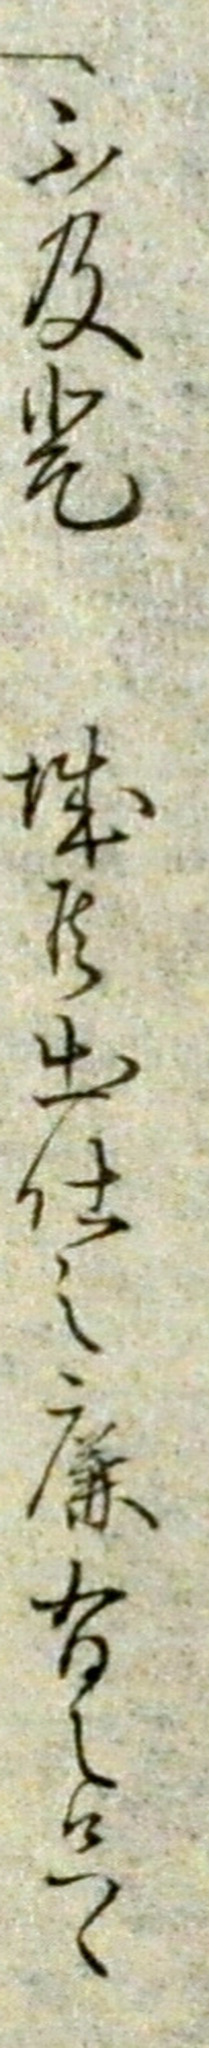不及登城候出仕之廉有之候ハヽ
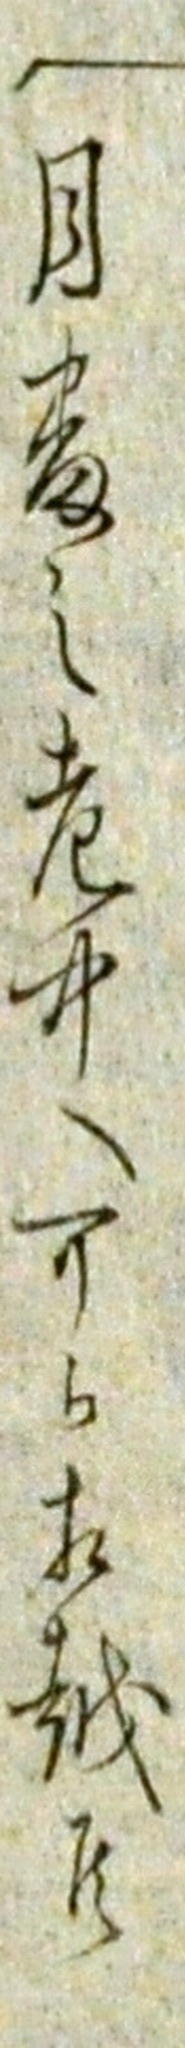月番之老中へ可被相越候
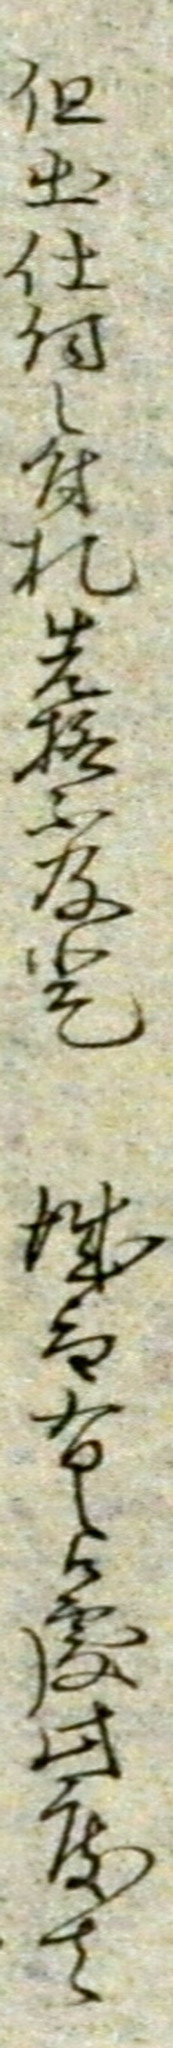但出仕伺之付札先格不及登城旨有之候處此度者
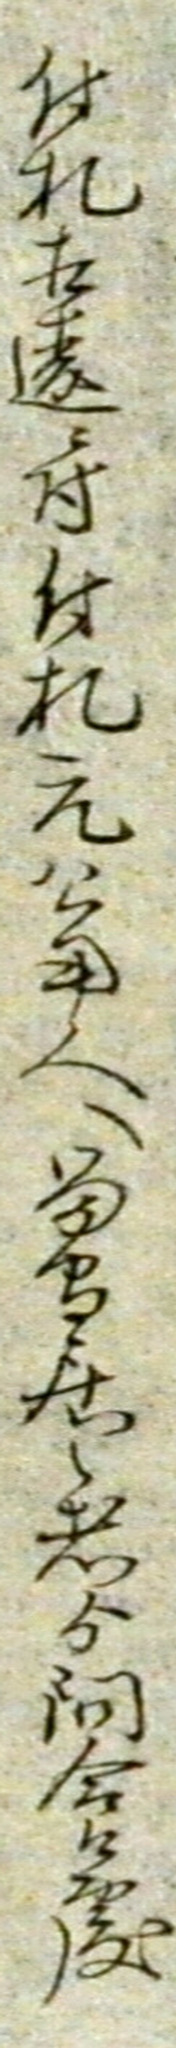付札相違二付付札元公用人へ留守居之者ゟ問合候處
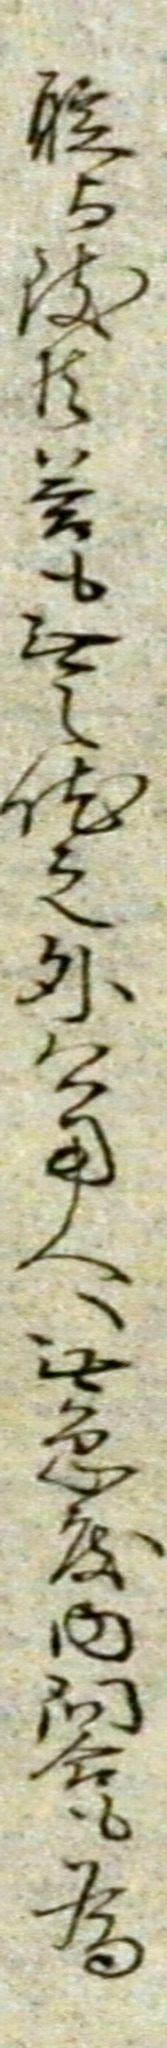聢与致候答も無之依之外公用人へ無急度内問合も為
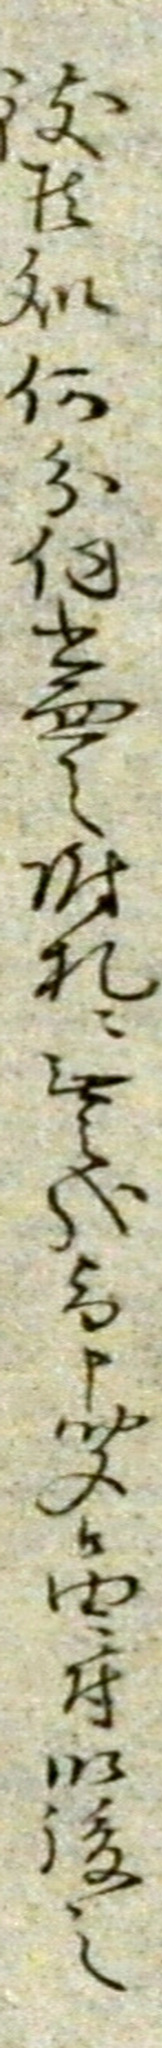致候処何分伺書面之附札ニ無之哉旨申聞候由ニ付以後之
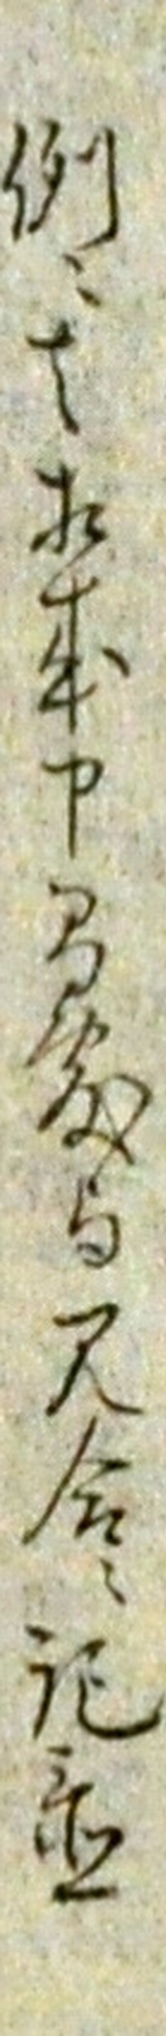例ニ者相成申間敷与見合ニ記置
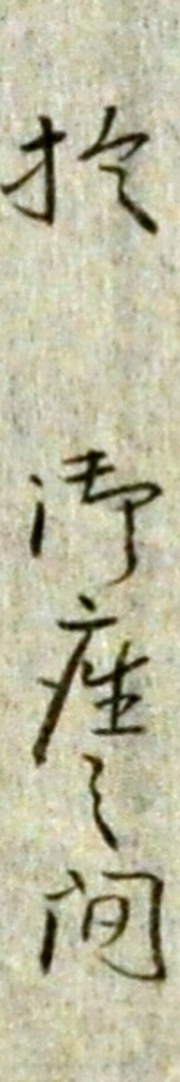於御座之間
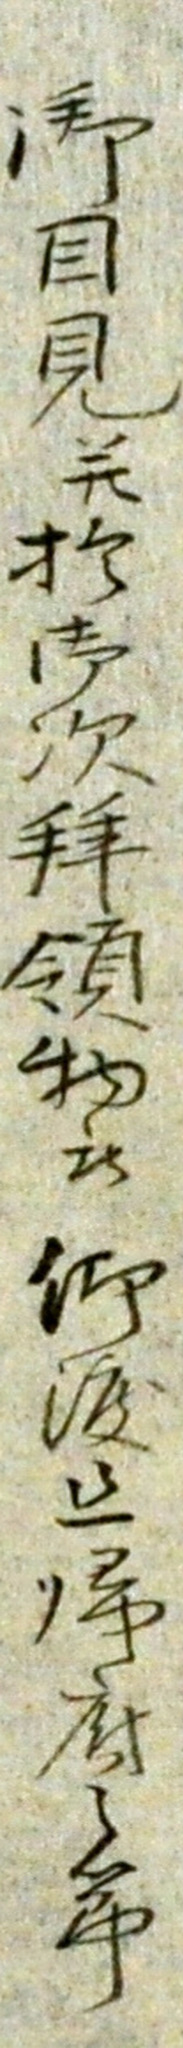御目見幷於御次拝領物被仰渡且帰府之節
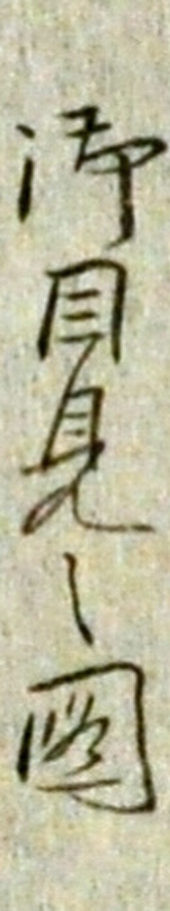御目見之図

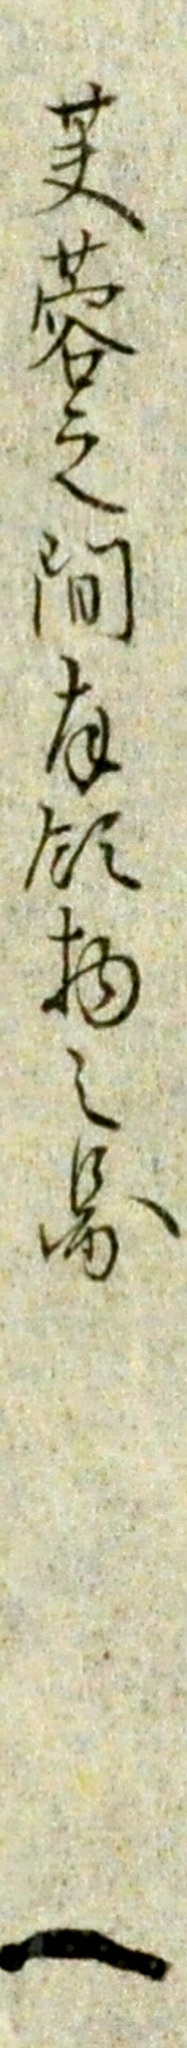芙蓉之間拝領物之図
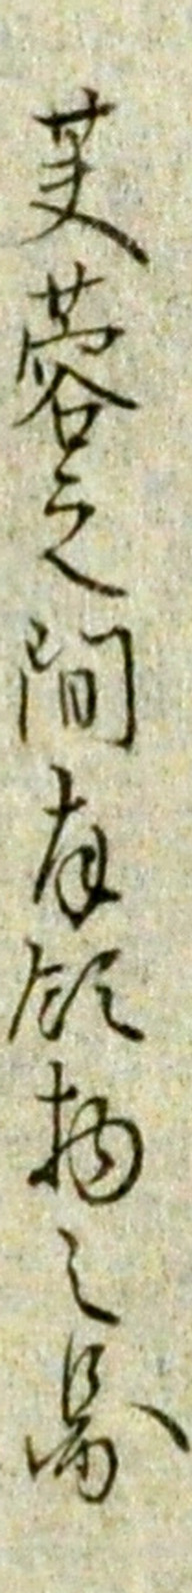芙蓉之間拝領物之図
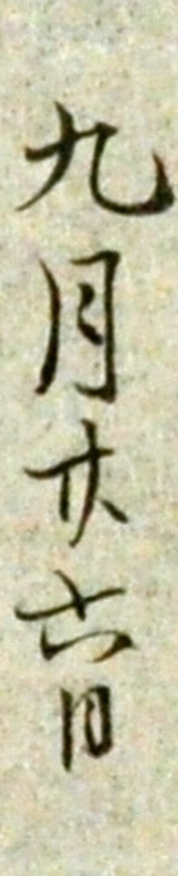九月廿六日
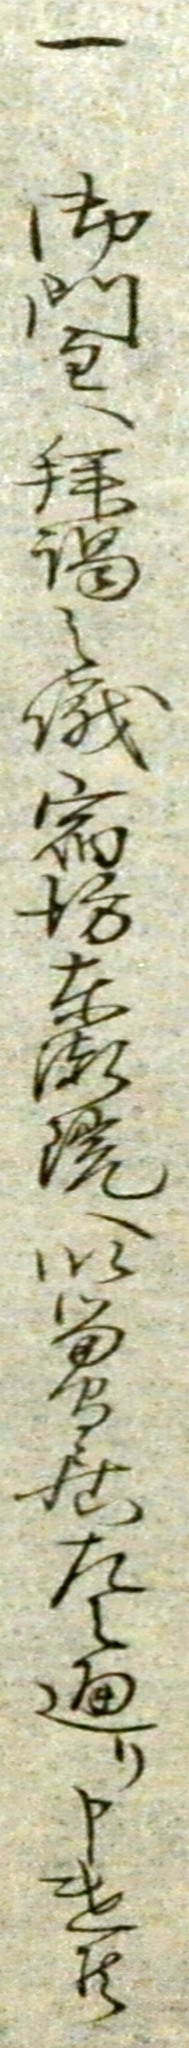一御門主へ拝謁之儀宿坊東漸院へ御留守居左之通り申遣候
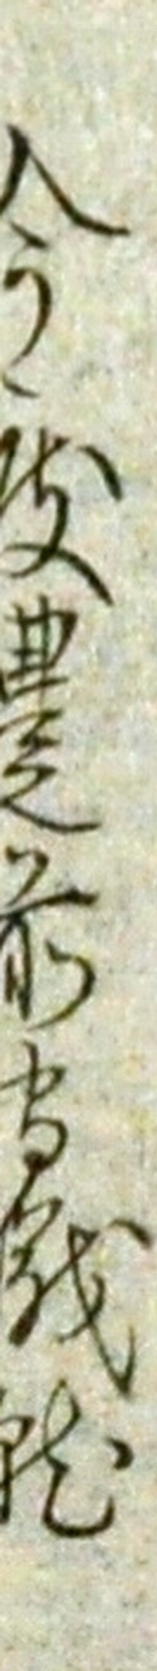今度豊前守儀就

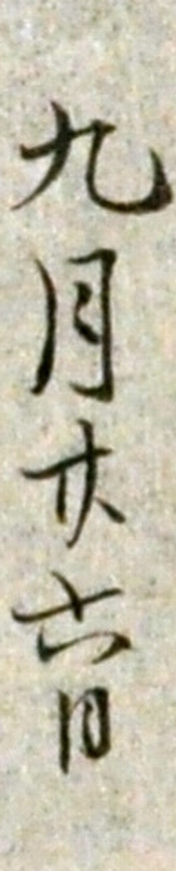九月廿六日
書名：日光御名代相勤候節ノ留
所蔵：伊那市立高遠町図書館・合同会社AMANE
